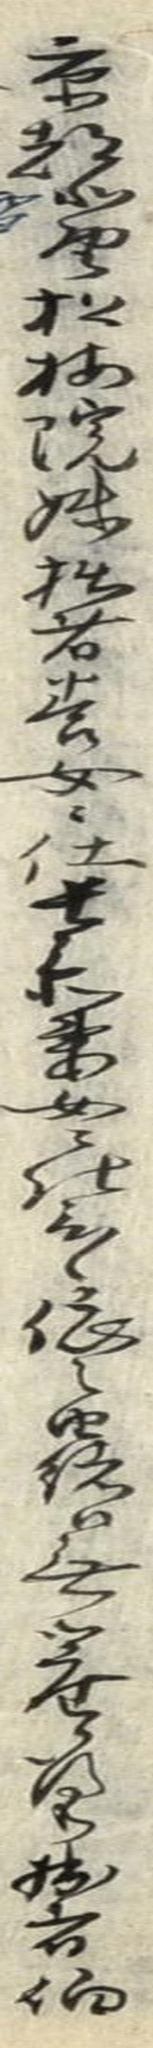京都北野松梅院妹拙者養女に長兵衛妻女に仕度依之由緒は無御座候得共拙者伯
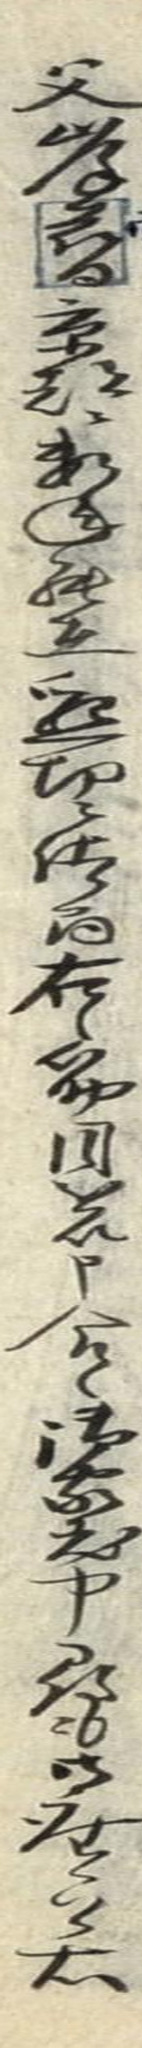父岸鷹京都に数年罷在懇切に仕候間右之筋目を以申合候御家老中尋も御座候はゝ右
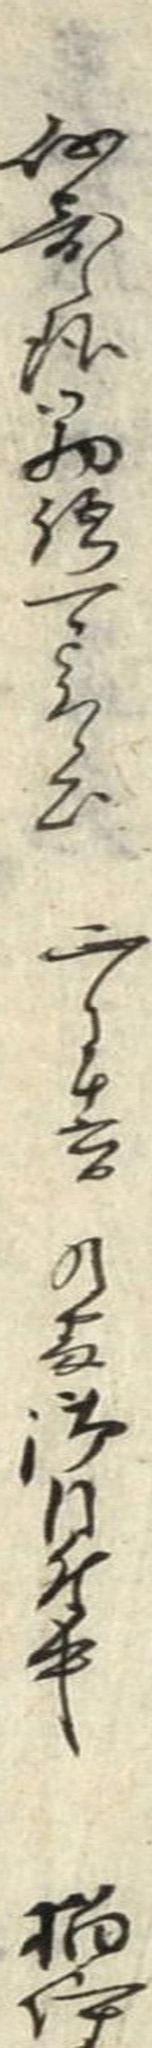存寄之趣御物語可被下候以上二月十六日月番御目付中柏伊勢
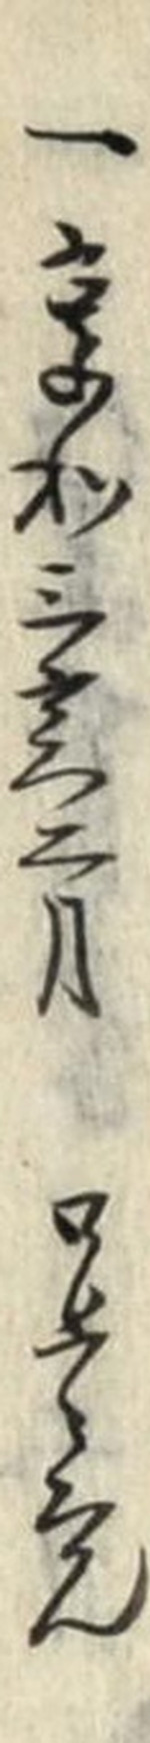一享和三亥二月口上之覚
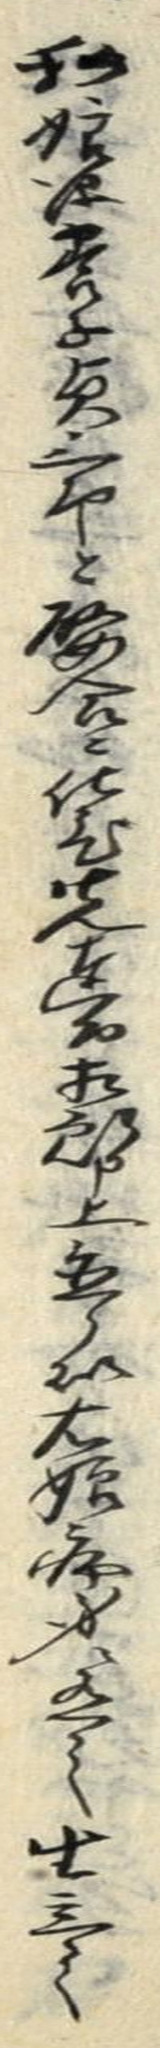私娘儀養子貞三郎と娶合に仕度先達而相願申上置候処右娘病身に有之生立之

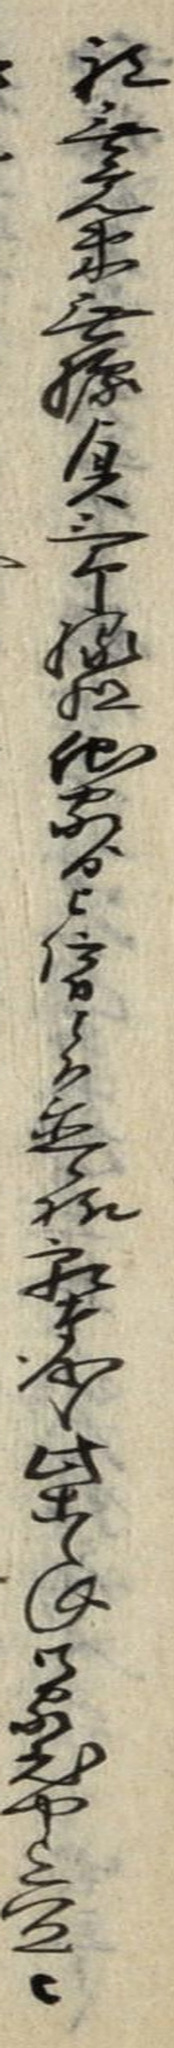程無覚束無拠貞三郎縁組他家ゟ被仰付被下置候願奉存候此等之趣御家老中迄宜被
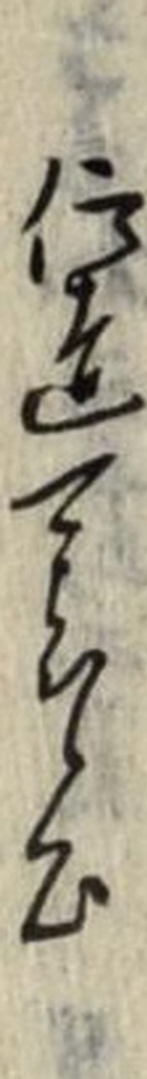置可被下候以上
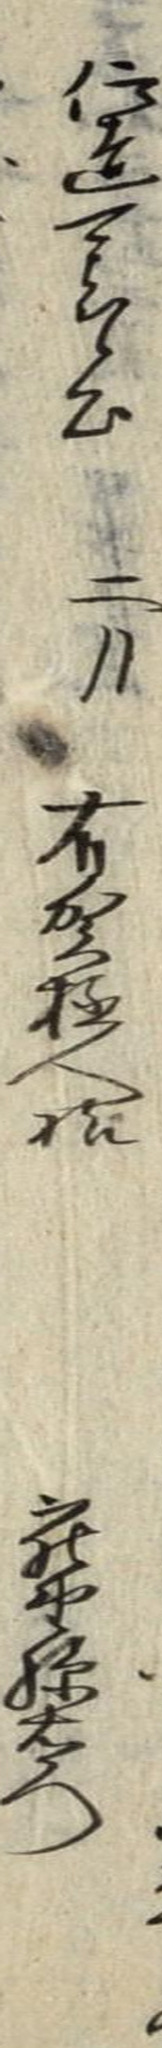仰達可被下候以上二月有賀極人様荻野孫右衛門
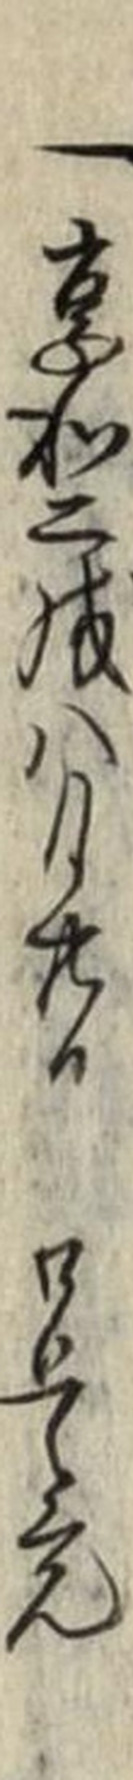一享和二戌八月廿日口上之覚
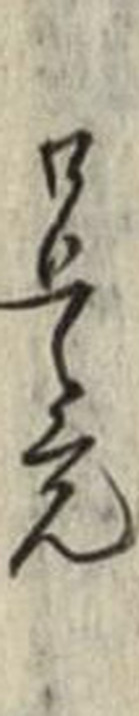口上之覚
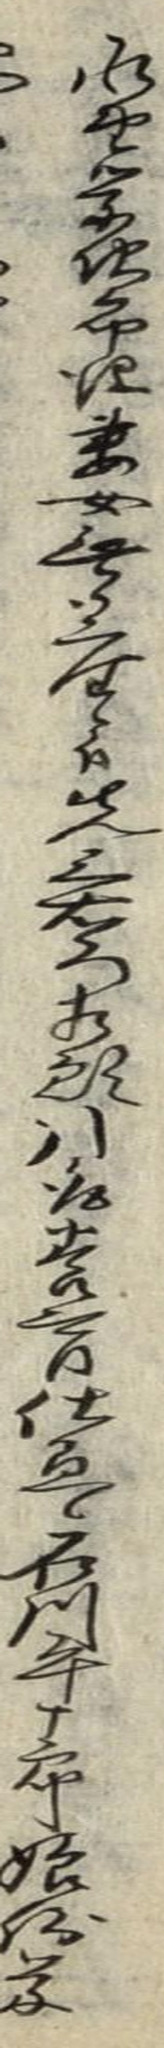水野栄次郎儀妻女無御座候ニ付先三右衛門相願引取養育仕置候石川平十郎娘儀栄
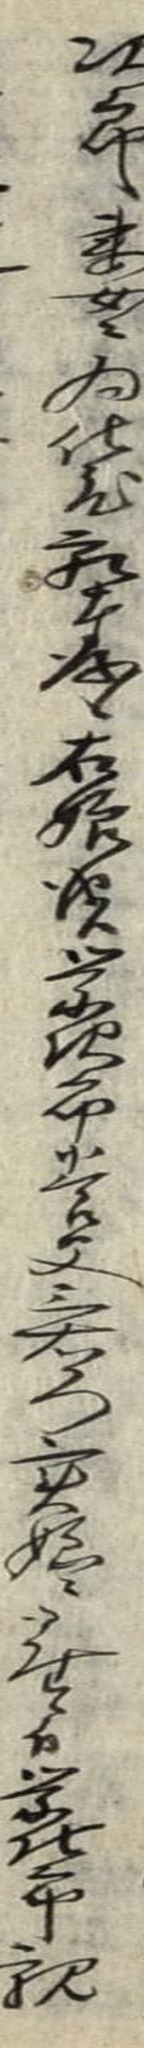次郎妻女ニ為仕度願奉存候右娘儀ハ栄次郎養父三右衛門実娘ニ御座候ニ付栄次郎親
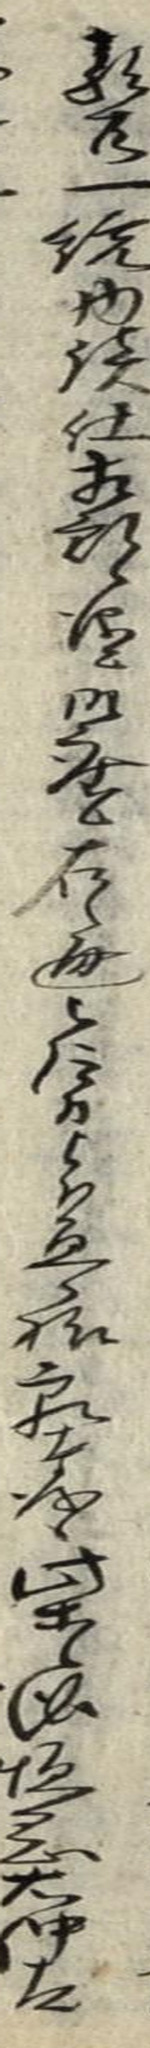類共一統内談仕相願候儀ニ御座候右之通被仰付被下置候様願奉存候此等之趣恒岡右仲太
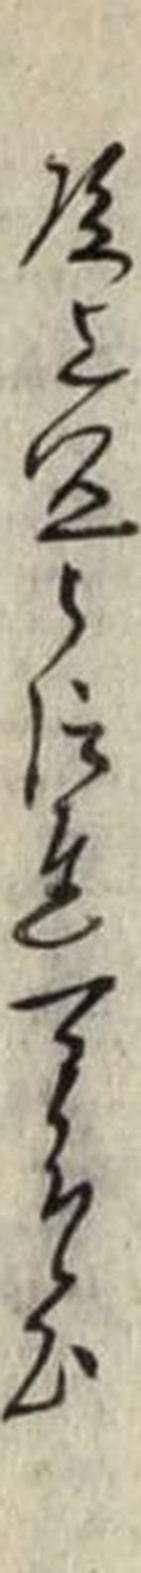殿迄宜被仰達可被下候以上
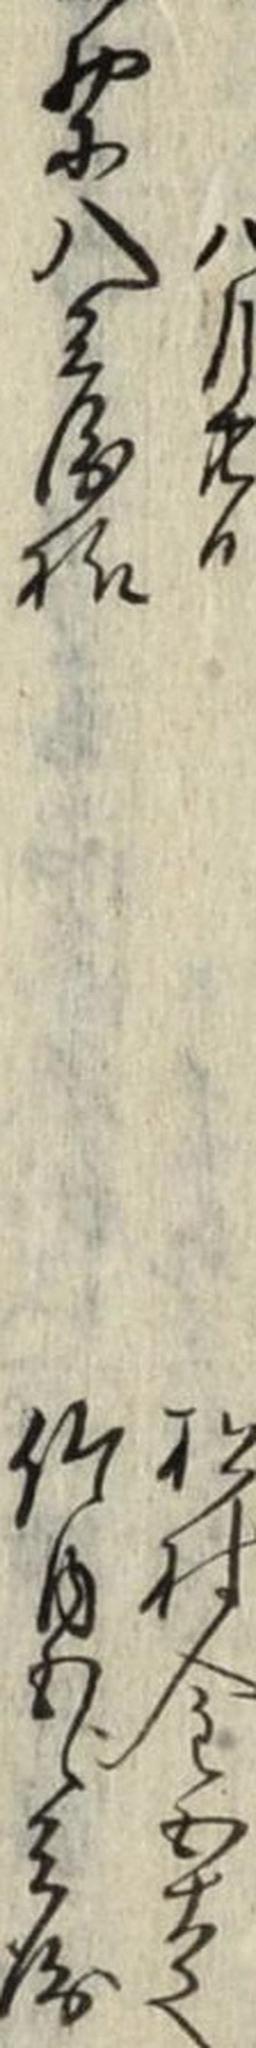小栗八兵衛様竹内五郎兵衛
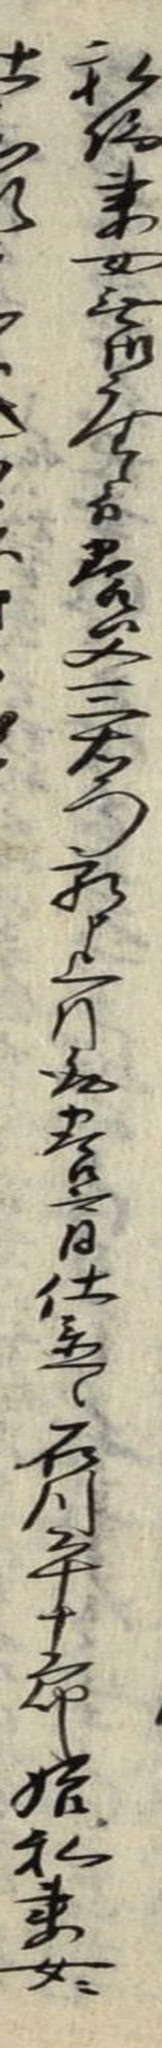私儀妻女無御座候ニ付養父三右衛門願申上引取養育仕置候石川平十郎娘私妻女ニ
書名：養子縁組之部
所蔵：福井県文書館 Fukui Prefectural Archives
